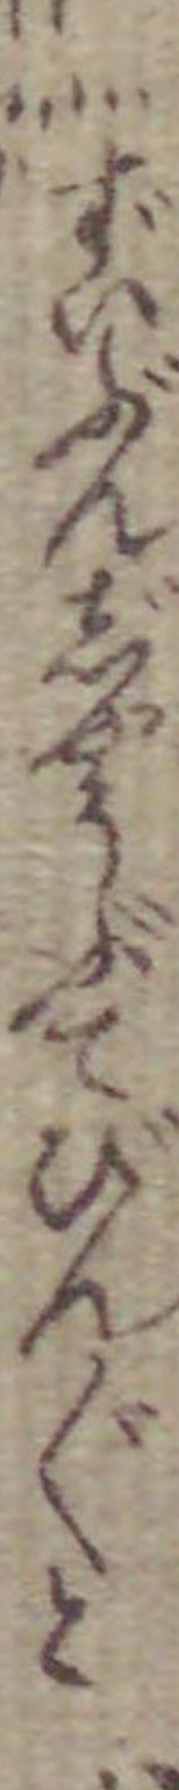ずいぶんじやうぶてびん〴〵と
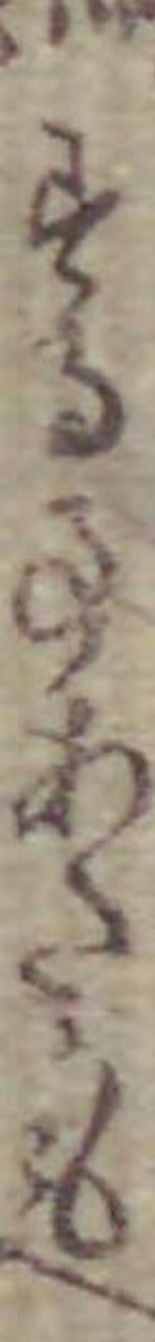する事あたかも
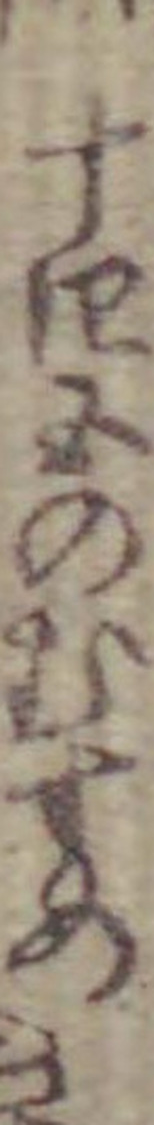十四五のむすめ
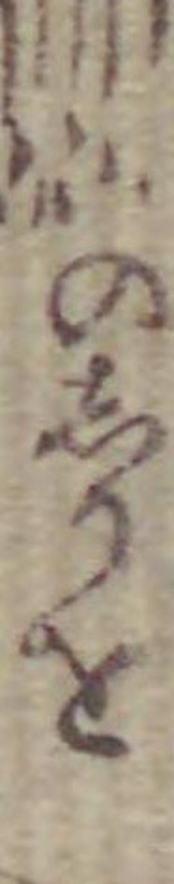のしりを
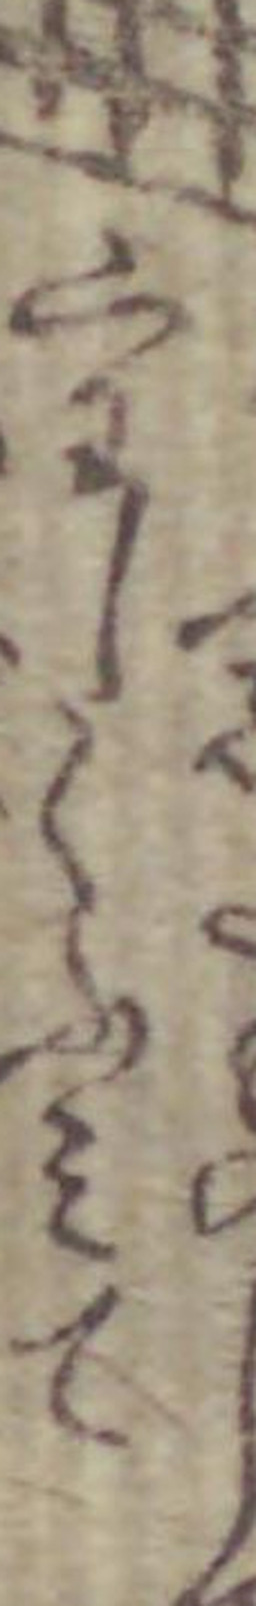くわしくふみて
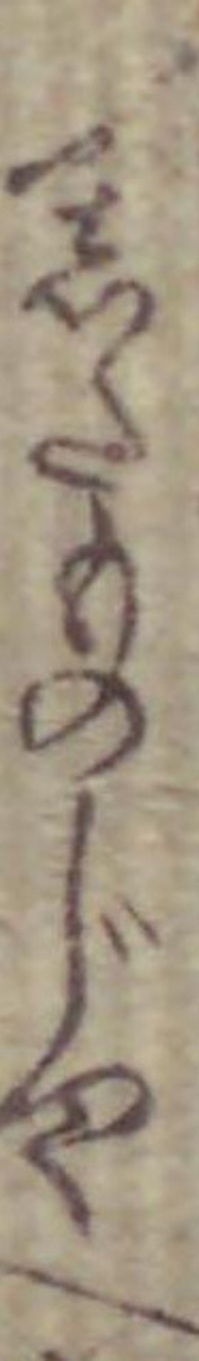どふしたものじや
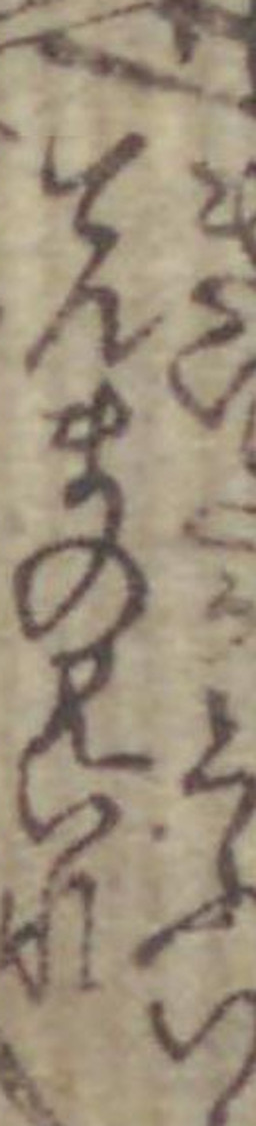てんまの見いれ
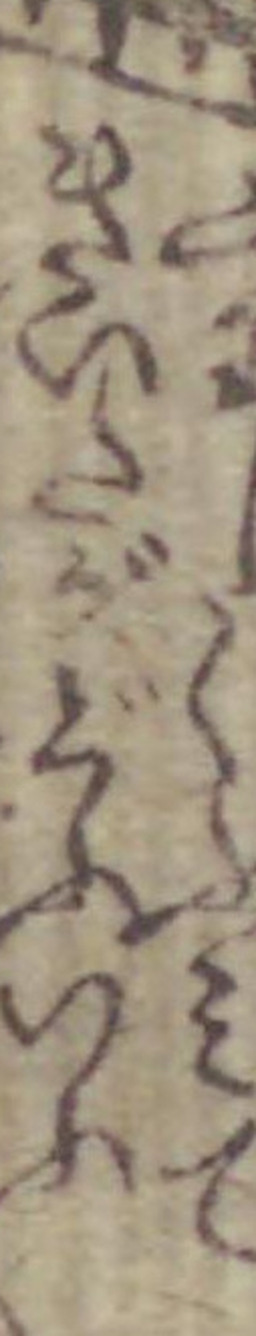きいたがどふいふ
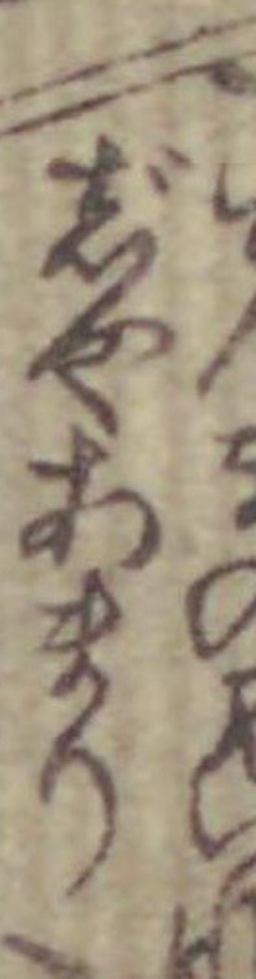じやあまり

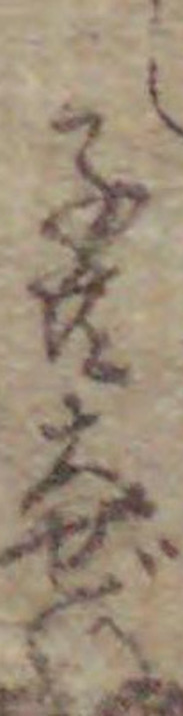子共大ぜい
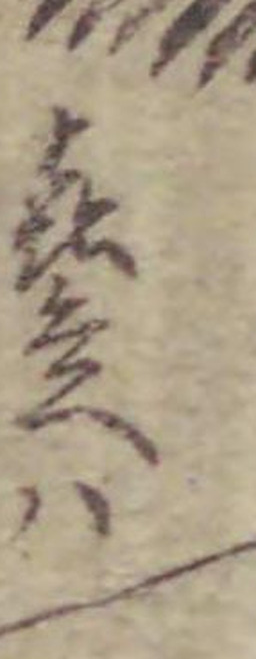喜兵へは
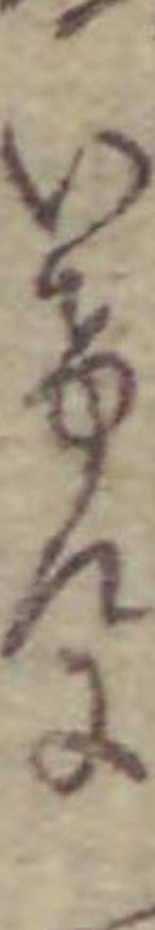いけんに
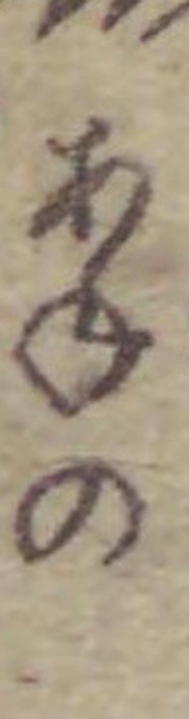あねの
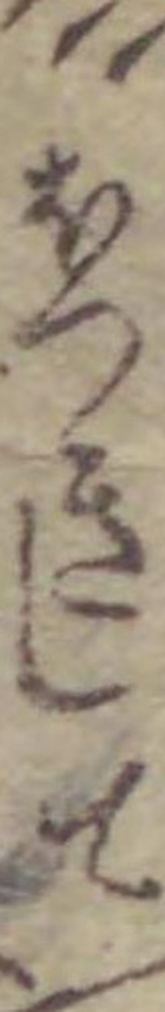ほつきして
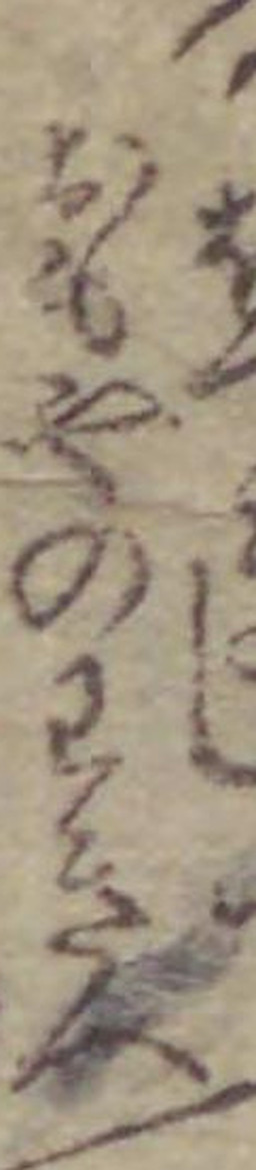おもやのわきへ
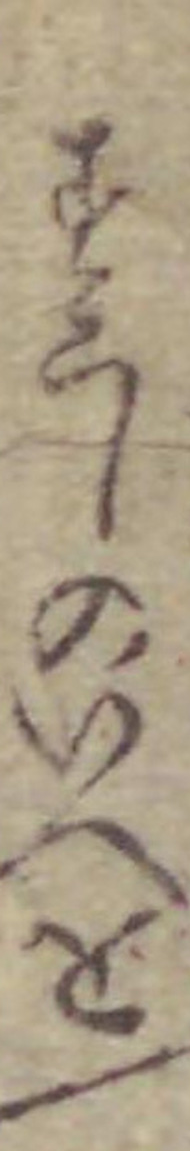すこしのいへを
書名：親父布子鳶握 3巻
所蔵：国立国会図書館 National Diet Library, JAPAN
